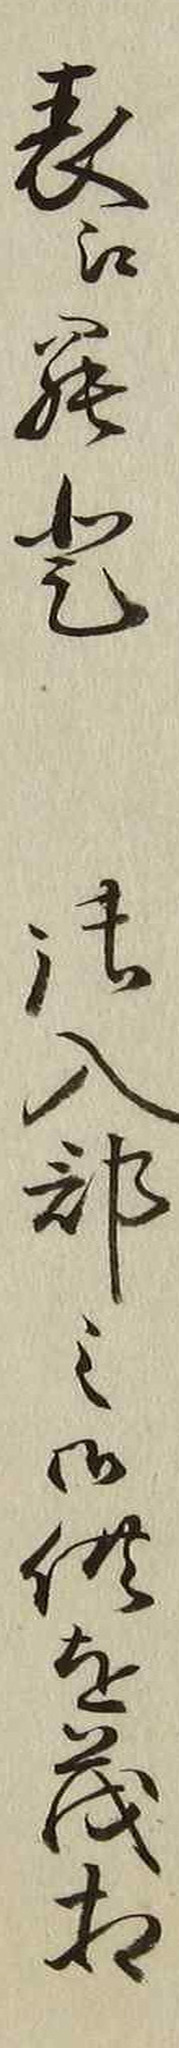表江罷登御入部之御供をも相
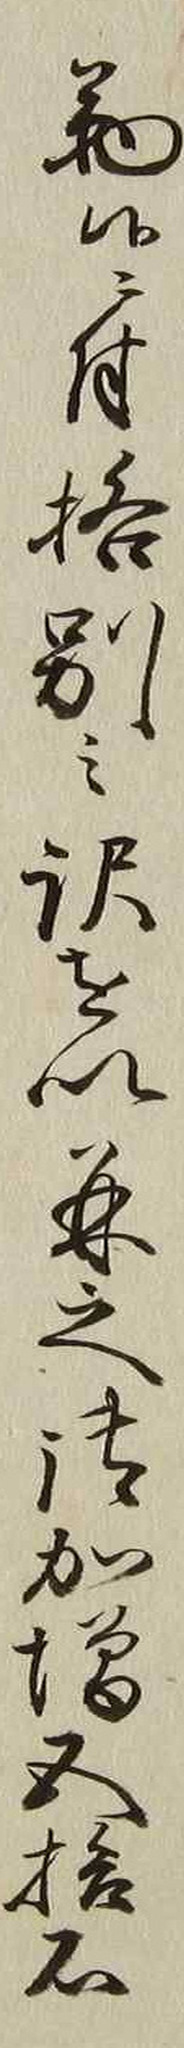勤候ニ付格別之訳を以再之御加増五拾石
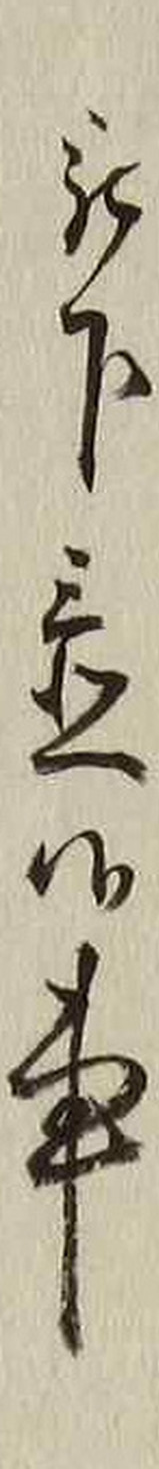被下置候事
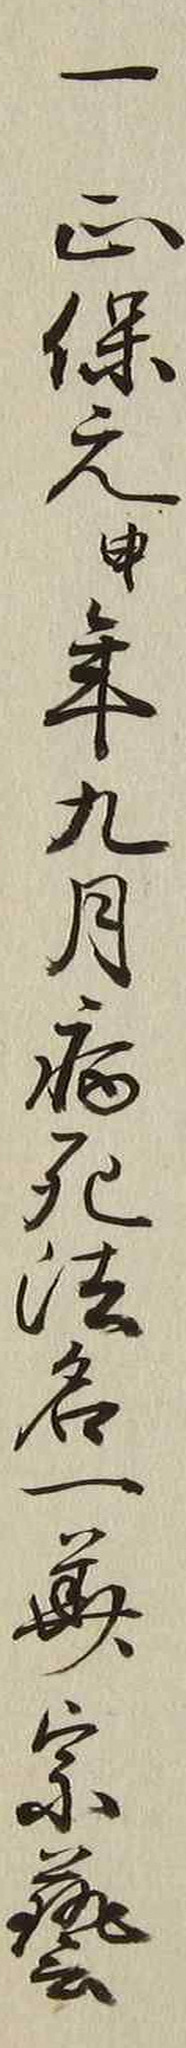一正保元申年九月病死法名一華宗芸
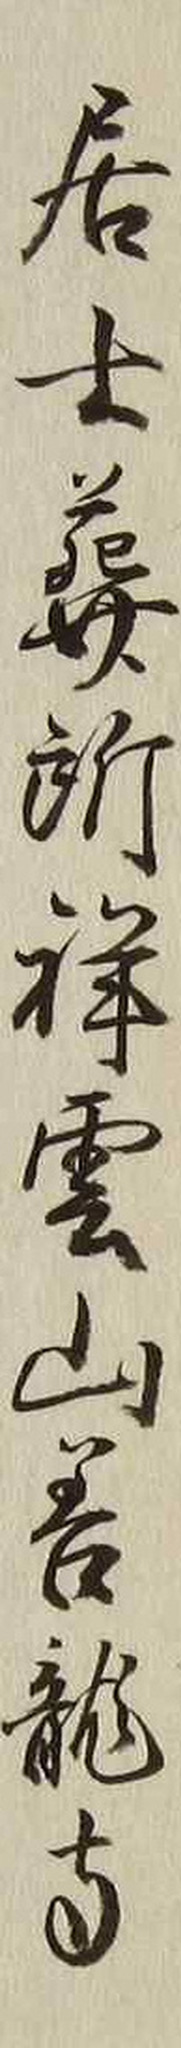居士葬所祥雲山善竜寺
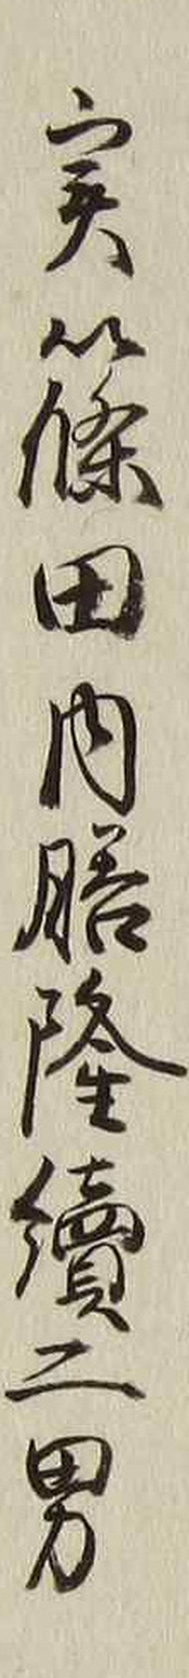実篠田内膳隆続二男
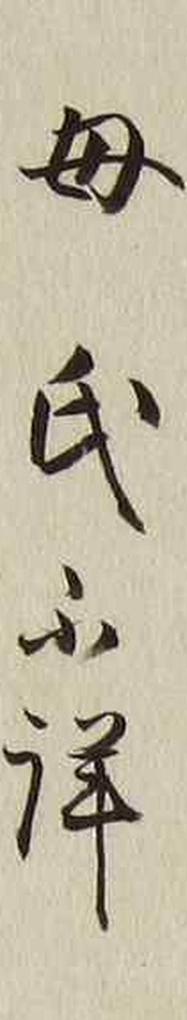母氏不詳
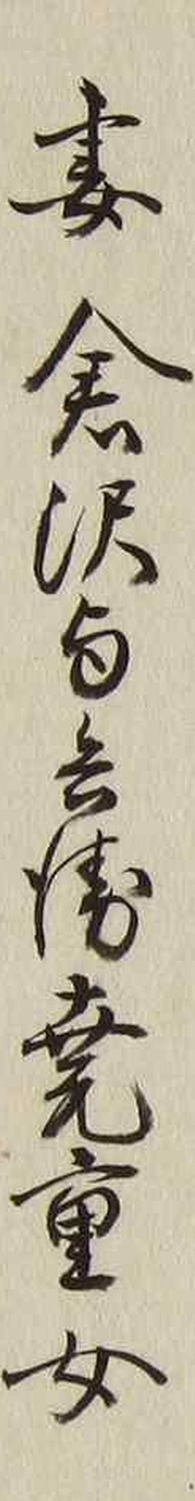妻倉沢与兵衛尭重女

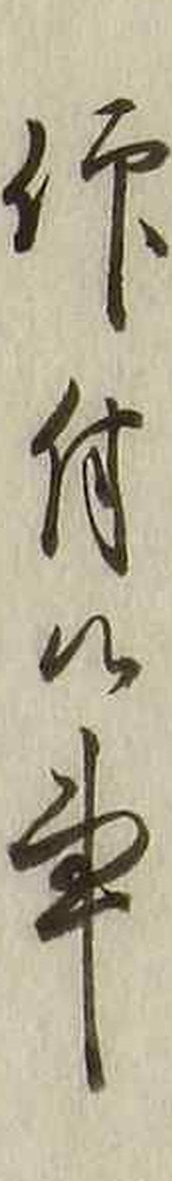仰付候事
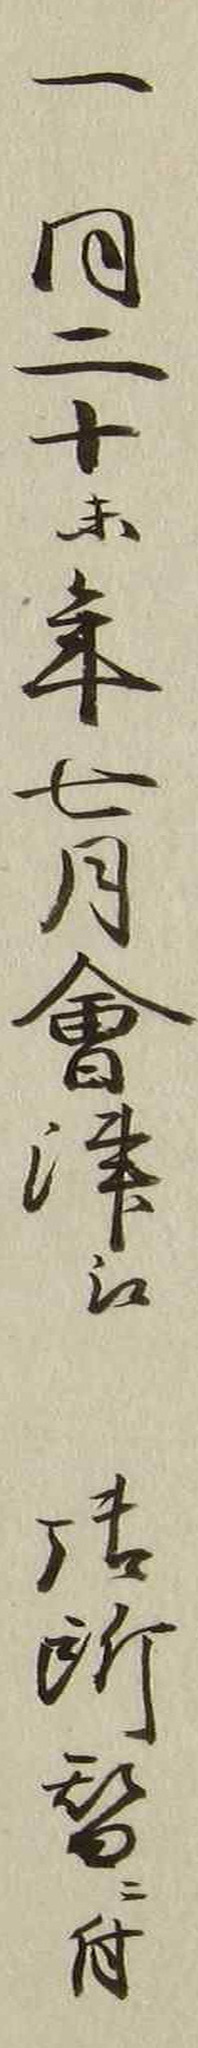一同二十未年七月会津江御所替ニ付
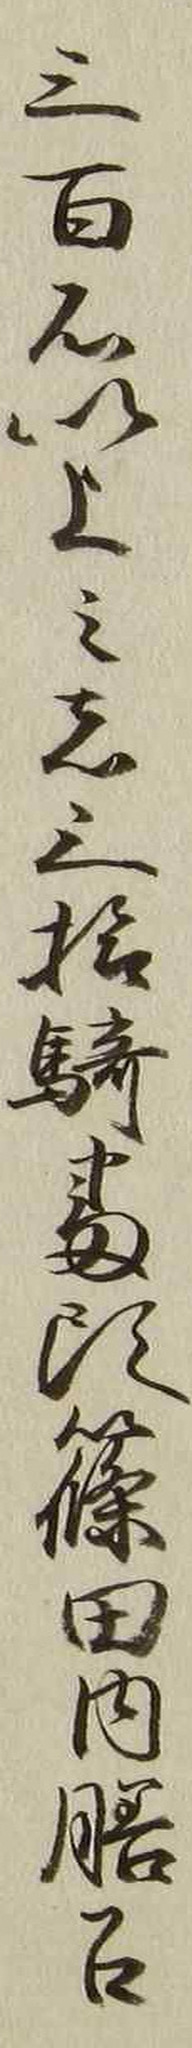三百石以上之者三拾騎番頭篠田内膳召
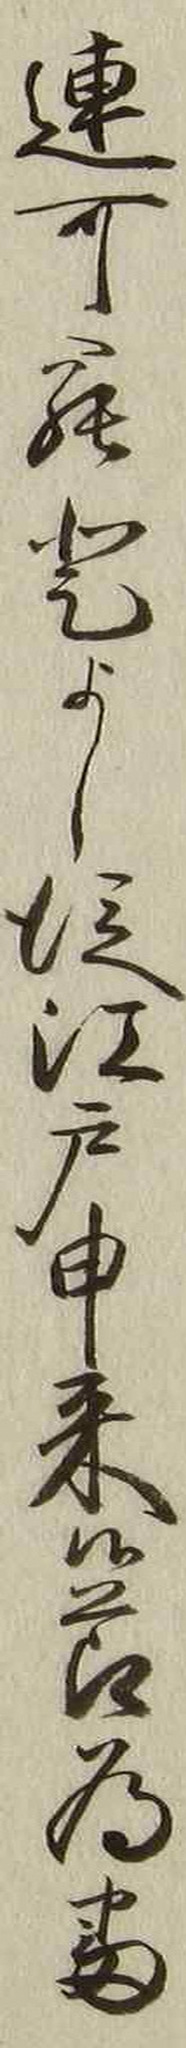連可罷登よし従江戸申来候節為番
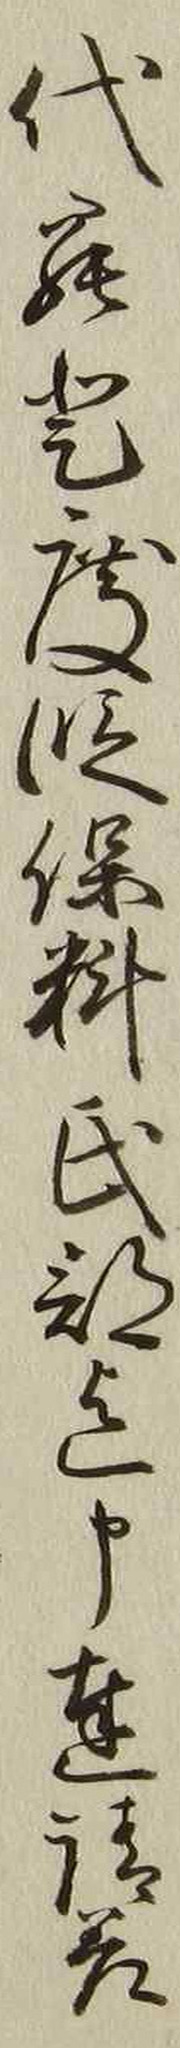代罷登度段保料民部迄申達請差
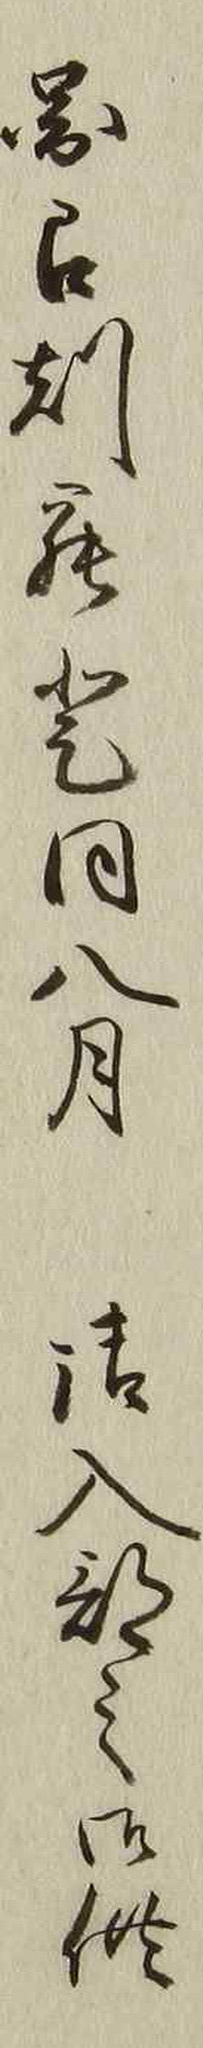図即刻罷登同八月御入部之御供
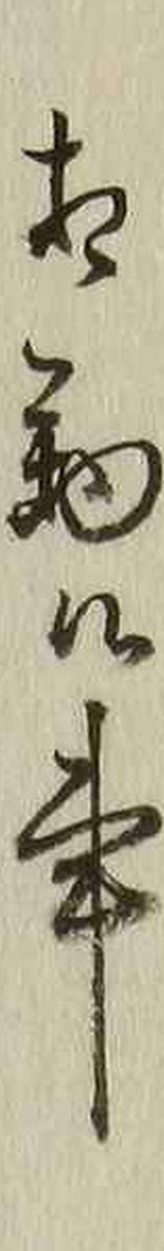相勤候事
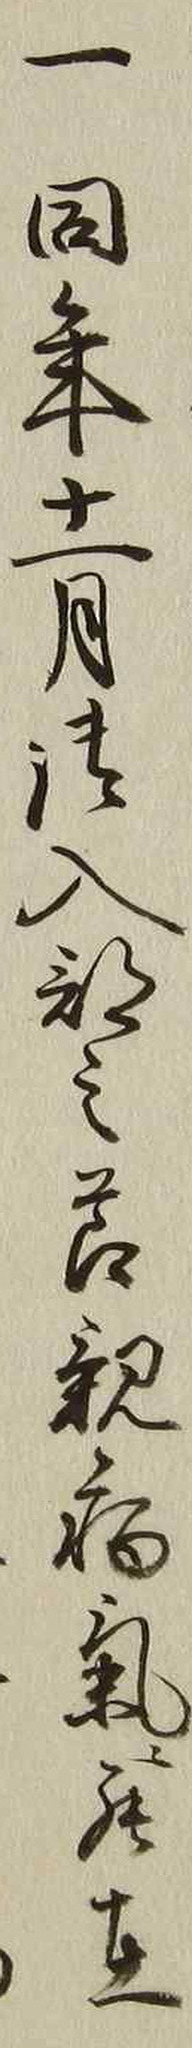一同年十一月御入部之節親病気ニ罷在
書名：諸士系譜　巻之15　い之部15
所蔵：会津若松市立会津図書館
